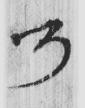乃
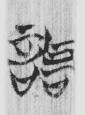詒
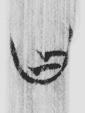曰
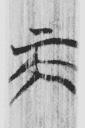天
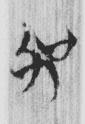加
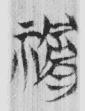禍
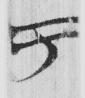于
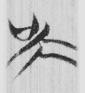吳
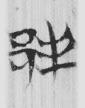邦
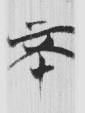不
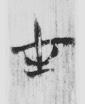才
